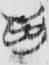爲
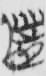○（僕）
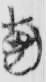○（斷）
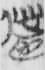○（僕）
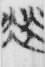○（勞）
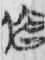倌
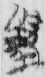頸
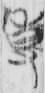事
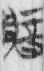𨟻（將）
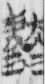灋
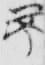不
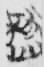○（憖）
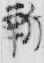新
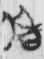俈
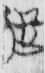○（卜）
